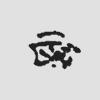晨
